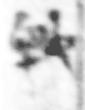牧
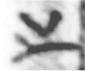之
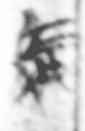駟
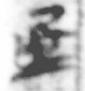爲
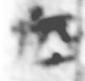○（左）
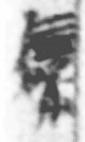○（服）
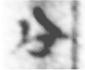公
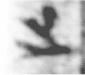之
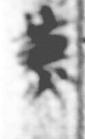黃
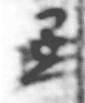爲
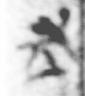○（右）
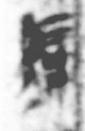○（服）
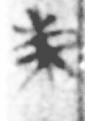朱
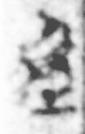○（路）
